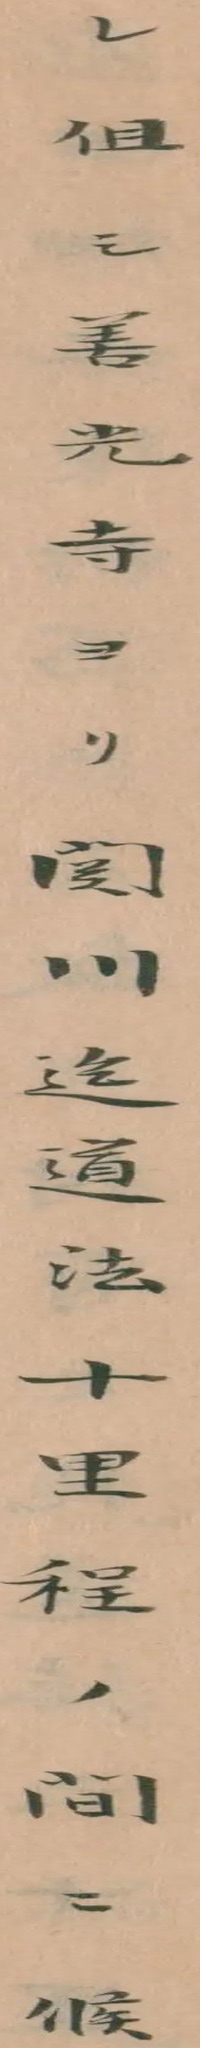レ但シ善光寺ヨリ関川迄道法十里程ノ間ニ候
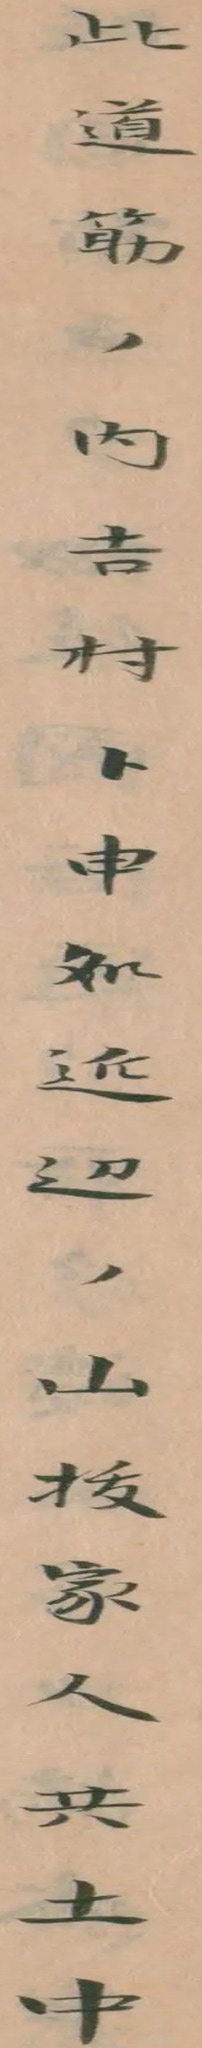此道筋ノ内吉村ト申処近辺ノ山抜家人共土中
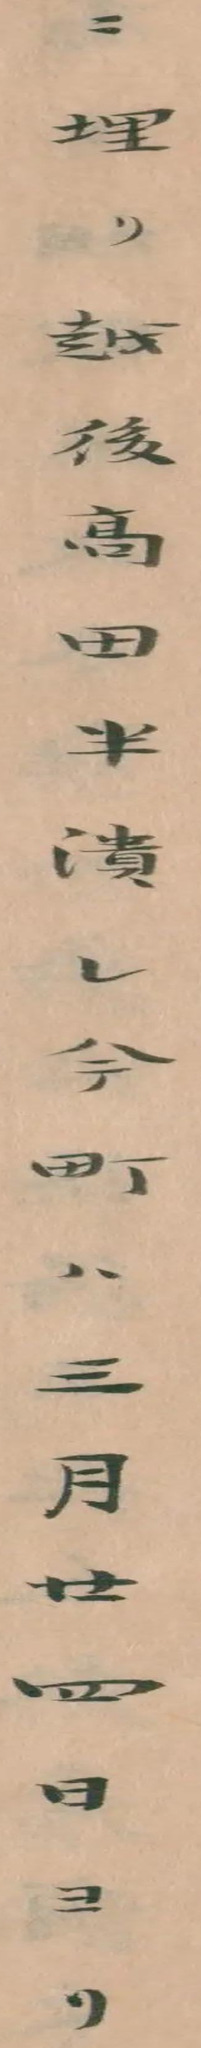ニ埋リ越後高田半潰レ今町ハ三月廿四日ヨリ
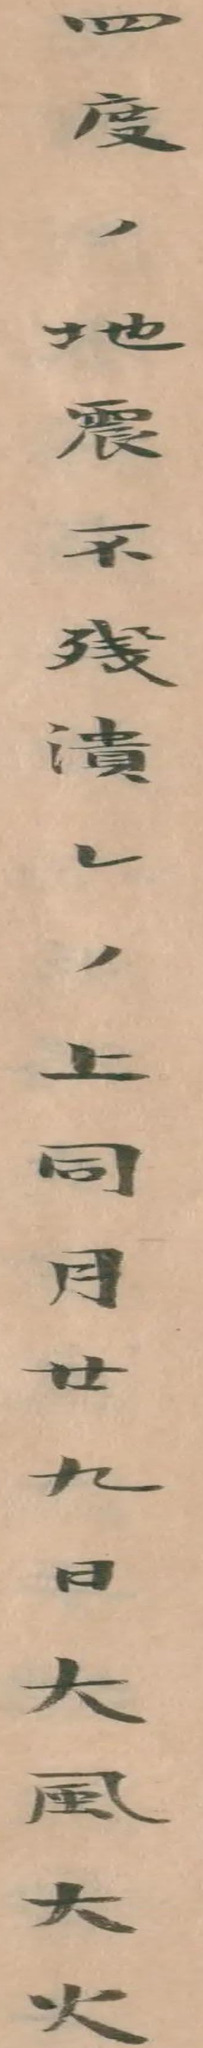四度ノ地震不残潰レノ上同月廿九日大風大火
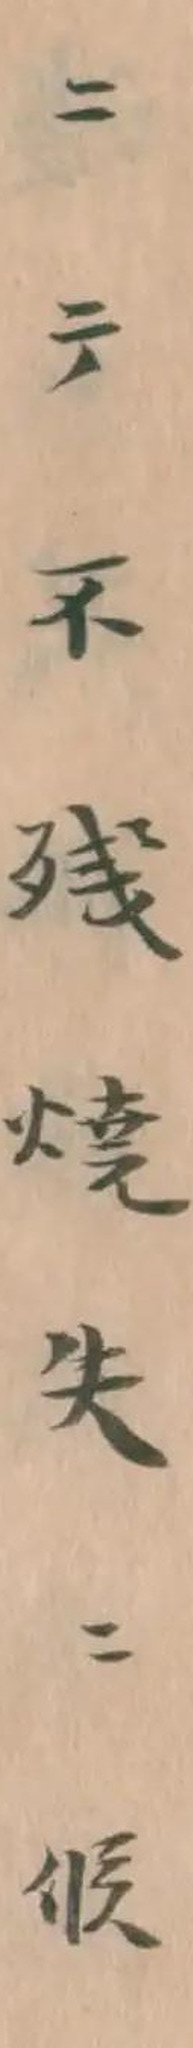ニテ不残焼失ニ候
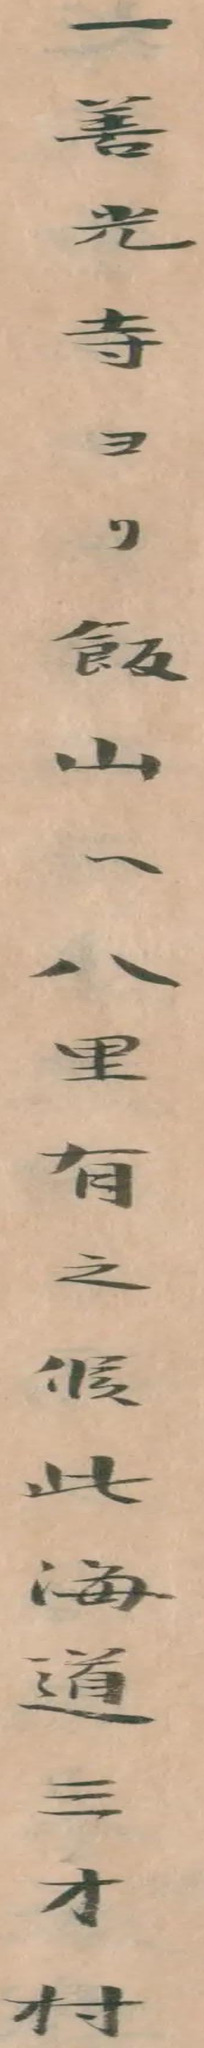一善光寺ヨリ飯山ヘ八里有之候此海道三才村
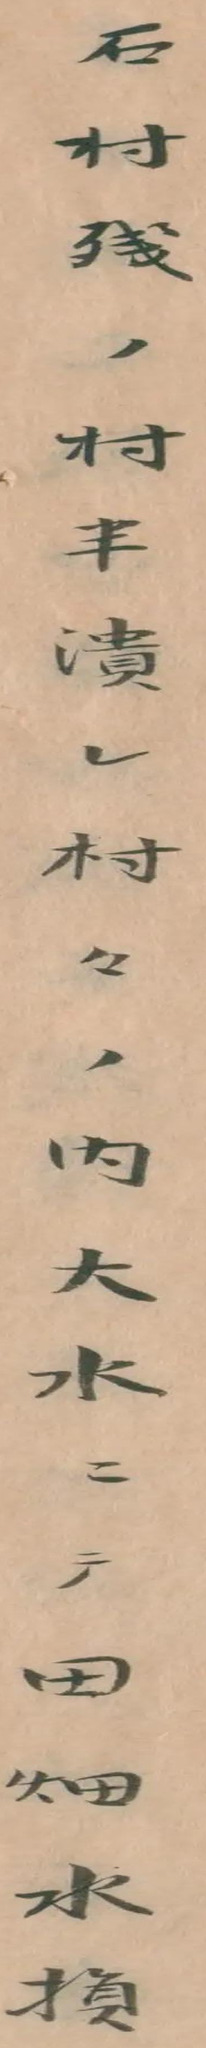石村残ノ村半潰レ村々ノ内大水ニテ田畑水損

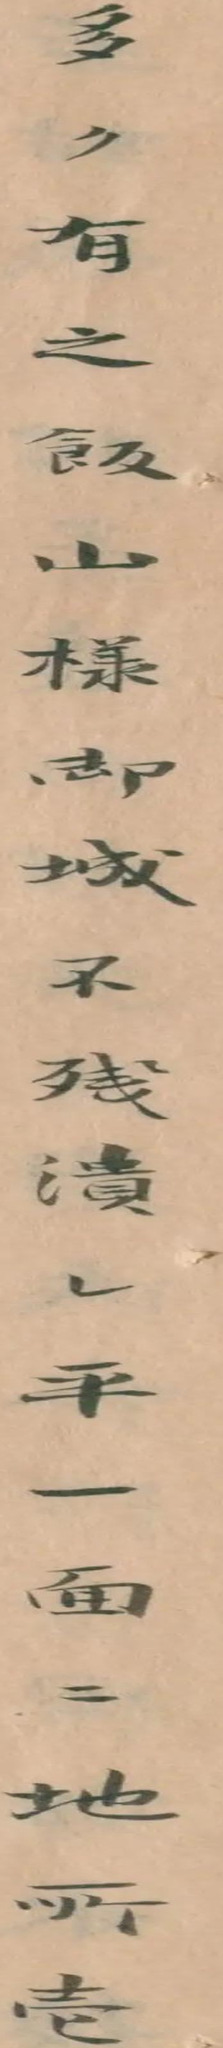多ク有之飯山様御城不残潰レ平一面ニ地所壱
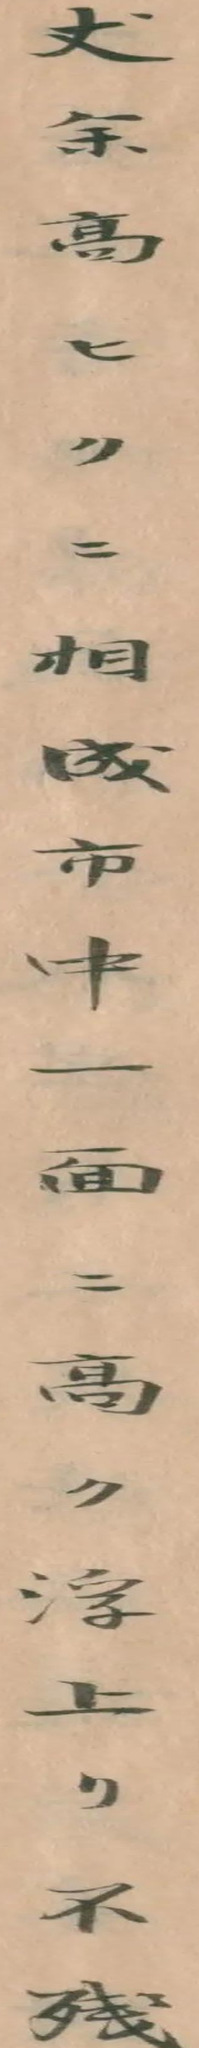丈余高ヒクニ相成市中一面ニ高ク浮上リ不残
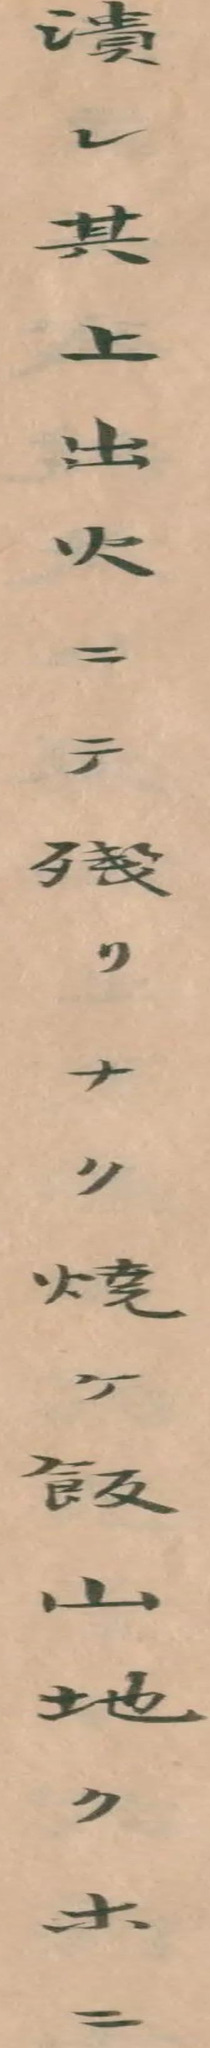潰レ其上出火ニテ残リナク焼ケ飯山地クホニ
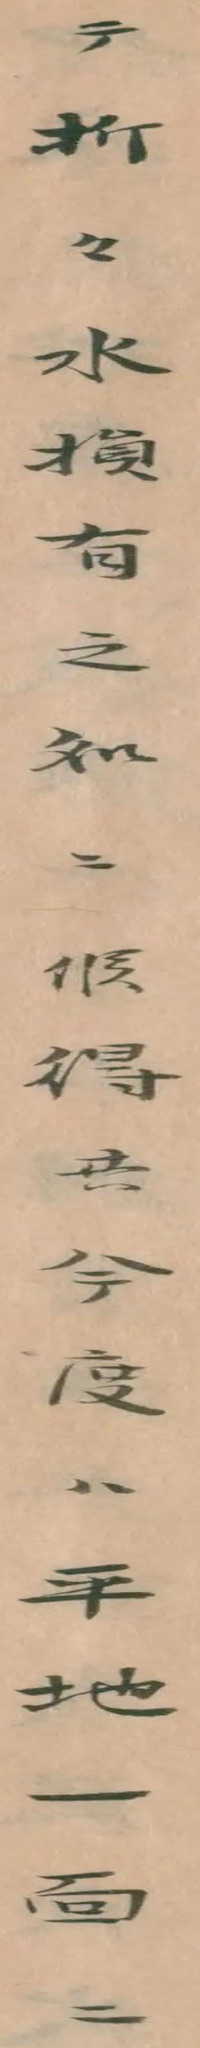テ折々水損有之処ニ候得共今度ハ平地一面ニ
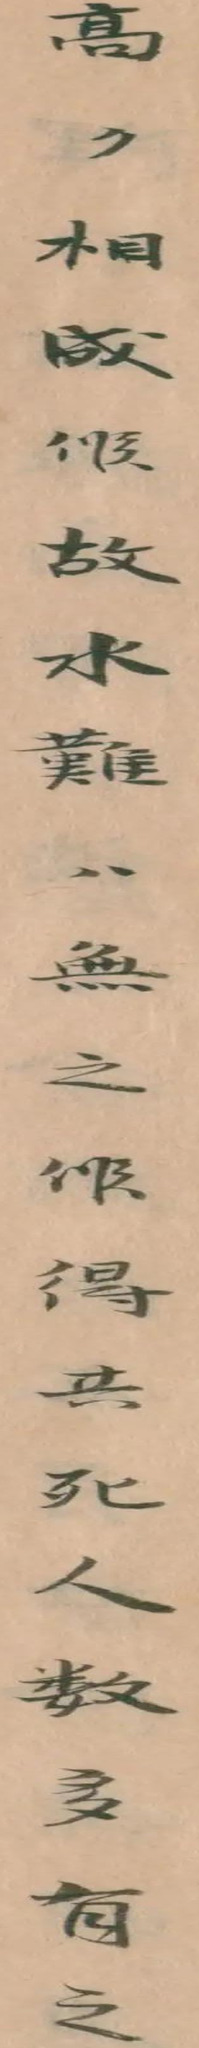高ク相成候故水難ハ無之候得共死人数多有之
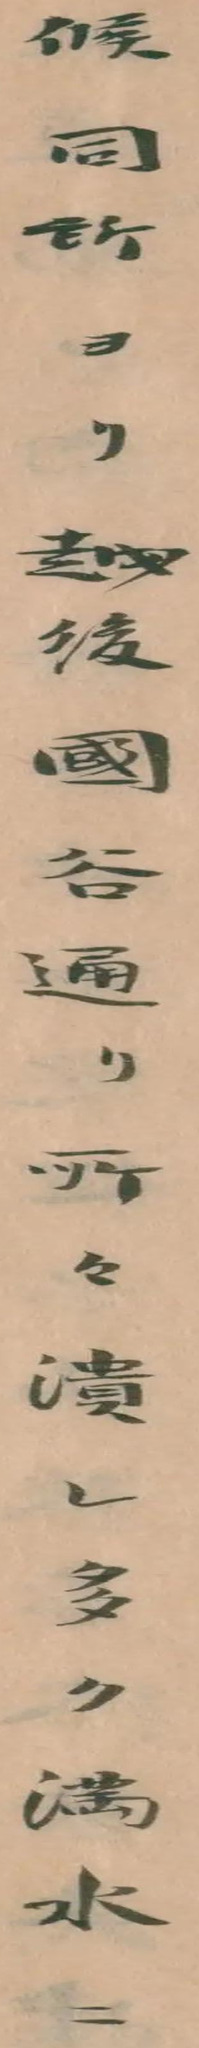候同所ヨリ越後国谷通リ所々潰レ多ク満水ニ
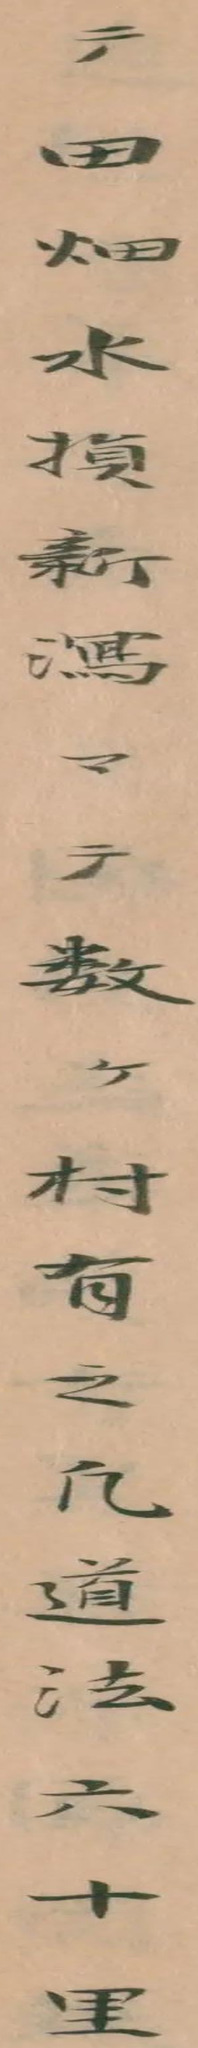テ田畑水損新潟マテ数ケ村有之凡道法六十里
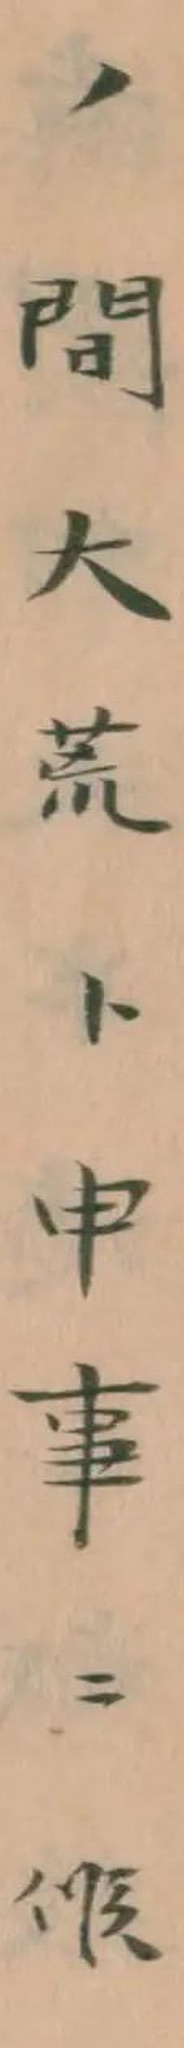ノ間大荒ト申事ニ候
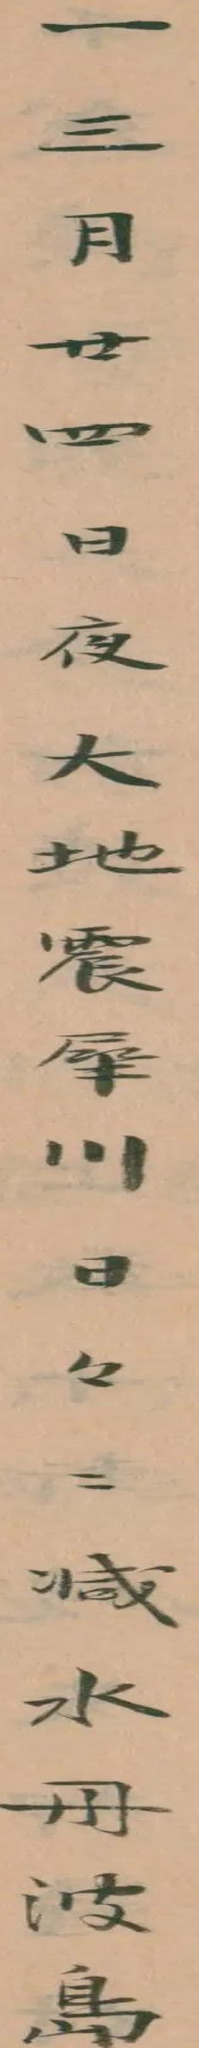一三月廿四日夜大地震犀川日々ニ減水丹波島
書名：地災撮要. 巻5-6(地震之部)
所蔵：国立国会図書館 National Diet Library, JAPAN
